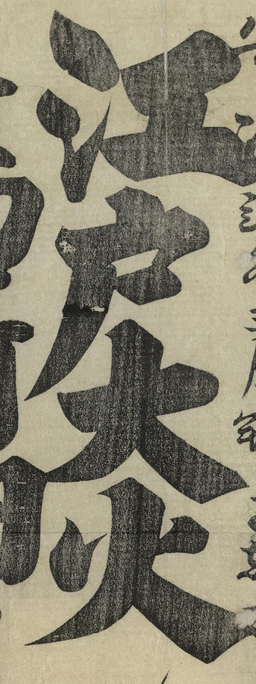江戸大火
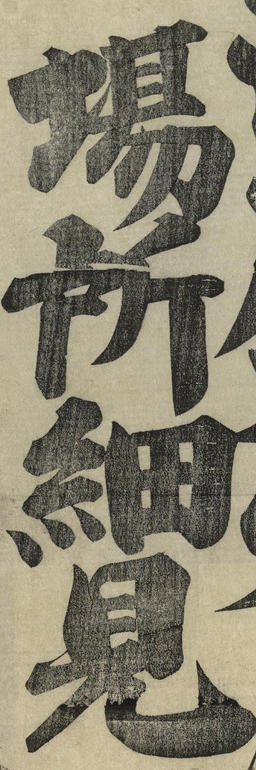場所細見
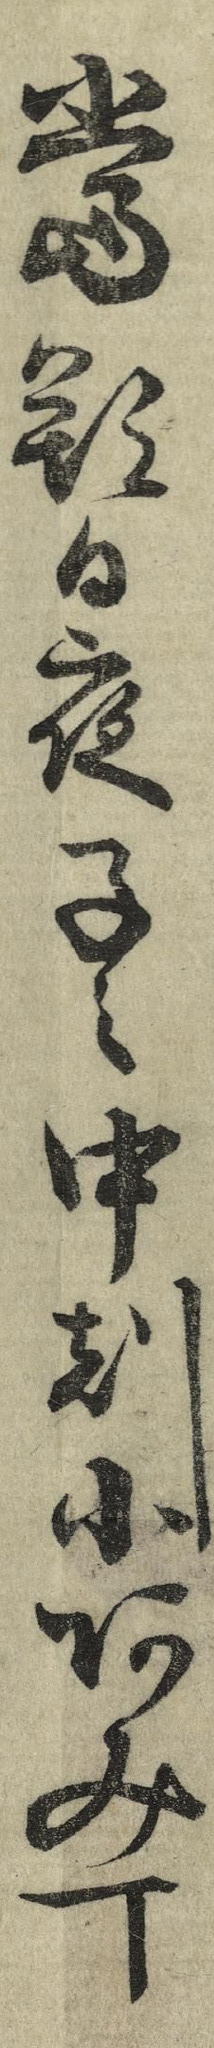当朔日夜子之中刻小あみ丁
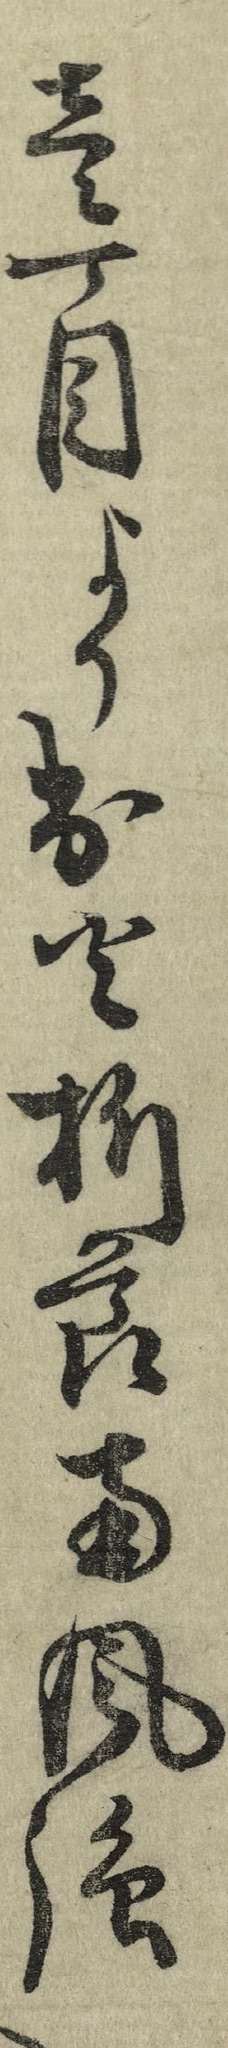壱丁目より出火折節南風強
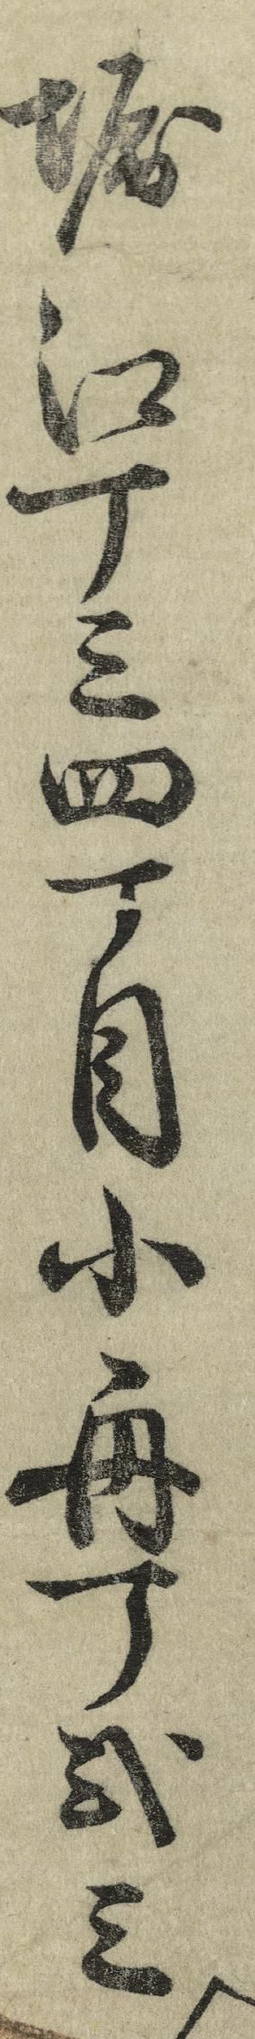堀江丁三四丁目小舟丁弐三
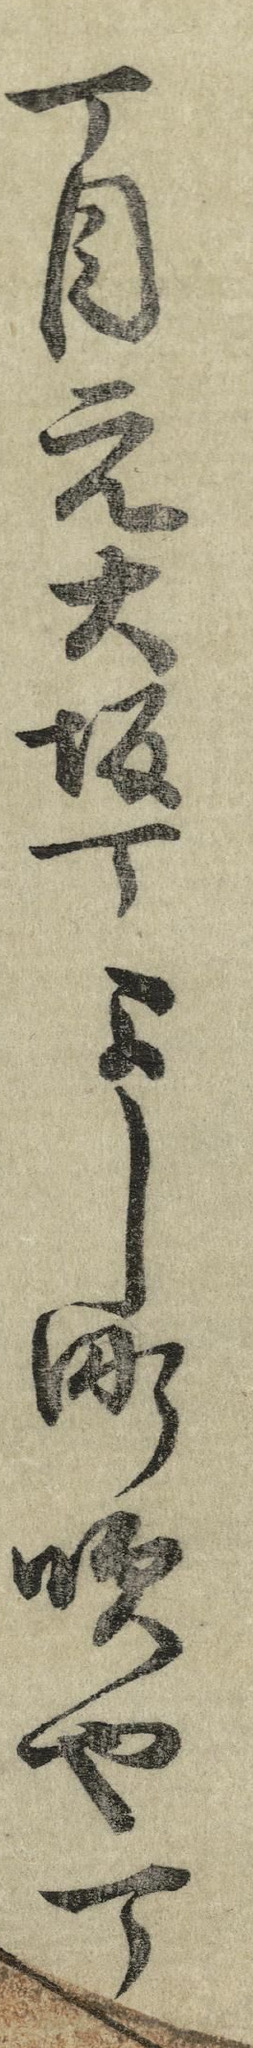丁目元大坂丁よし丁吹や丁
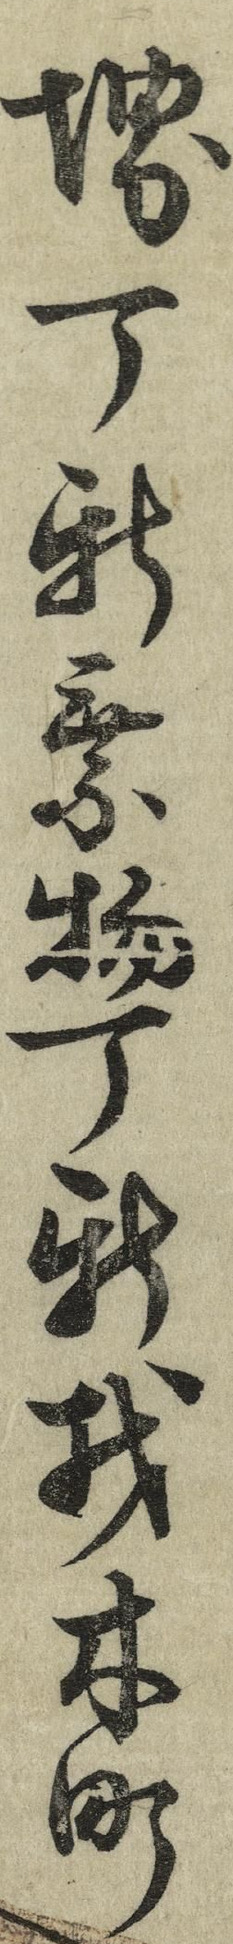増丁新乗物丁新材木町
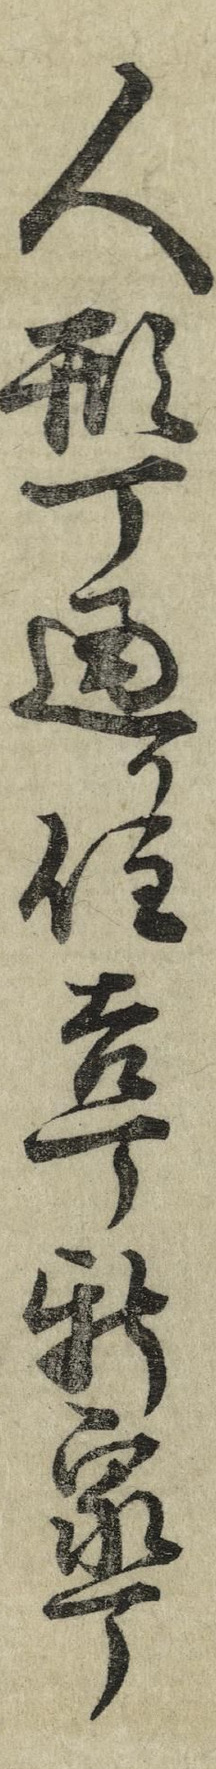人形丁通り住吉丁新泉丁
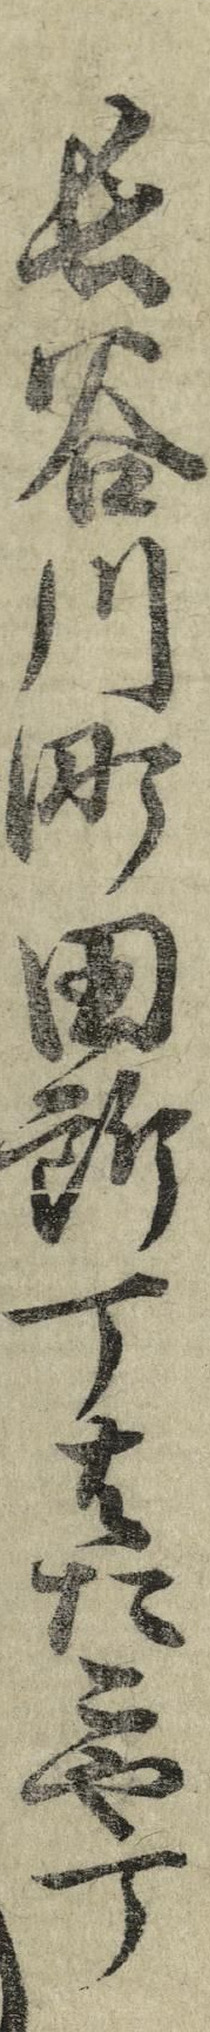長谷川町田所丁はたこや丁
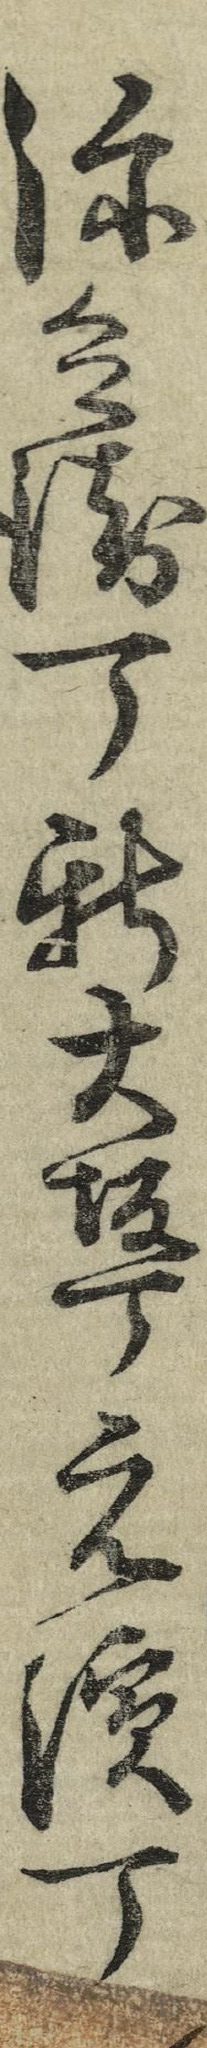弥兵衛丁新大坂丁元浜丁
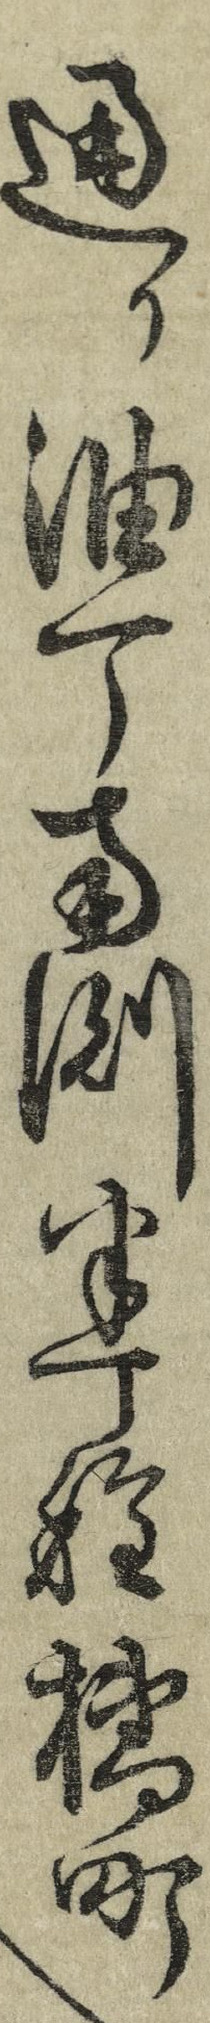通り油丁南側半丁程橘町
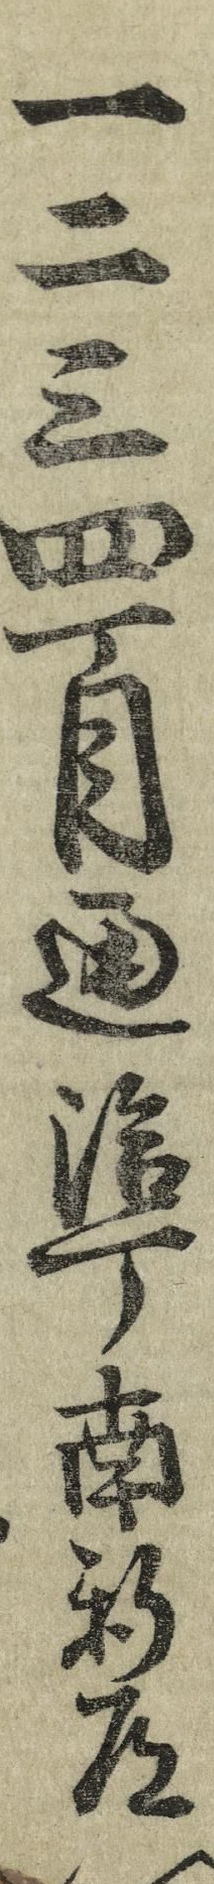一二三四丁目通塩丁南新道
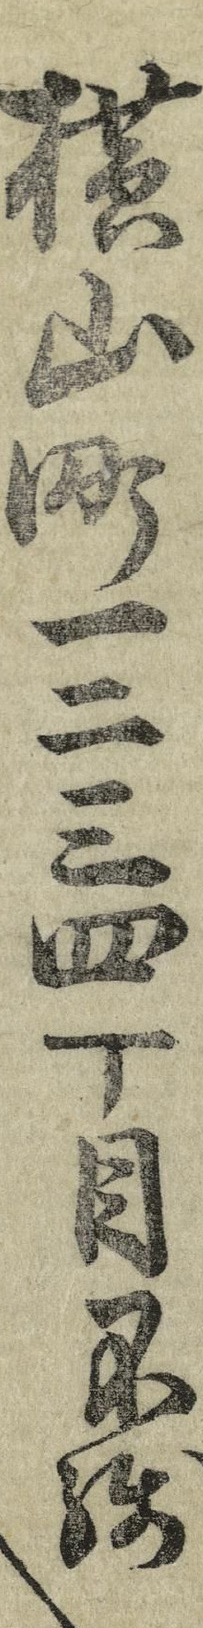横山町一二三四丁目不残
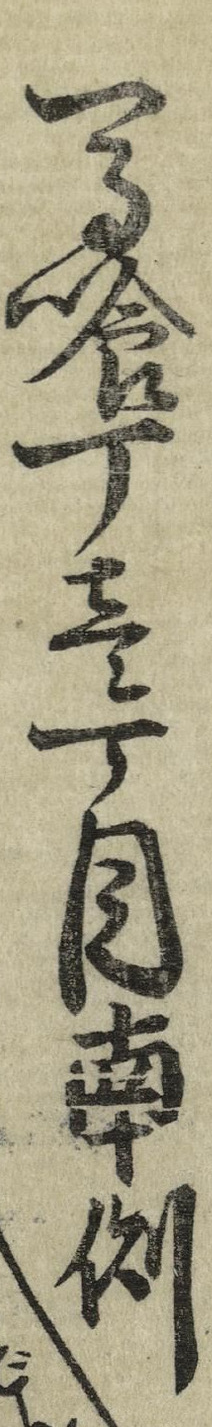馬喰丁壱丁目南側
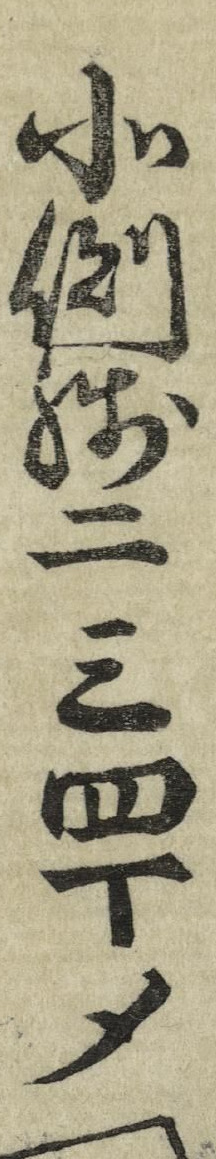北側残二三四丁メ
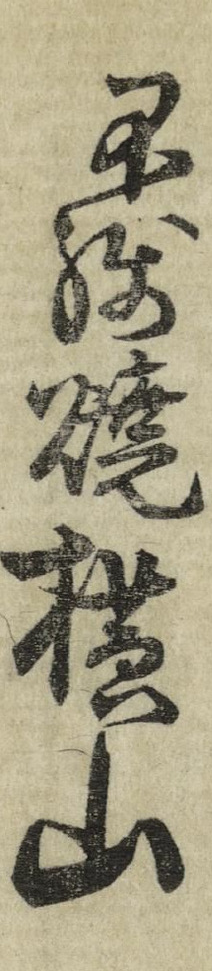不残焼横山
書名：江戸大火場所細見
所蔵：東京大学地震研究所図書室 Earthquake Research Institute Library, The University of Tokyo, JAPAN
